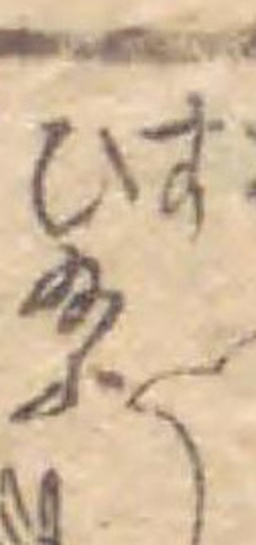ひ給ふ
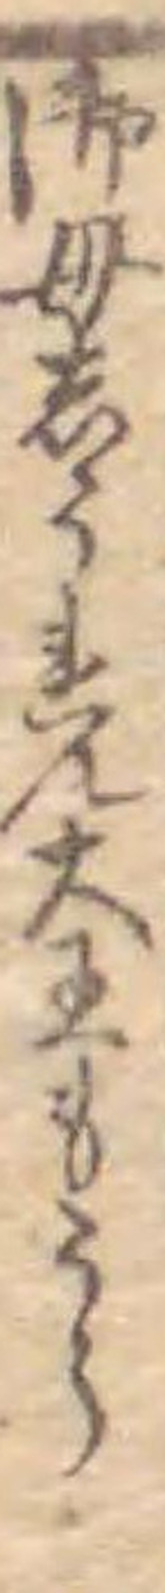御母しうれん大王もうら
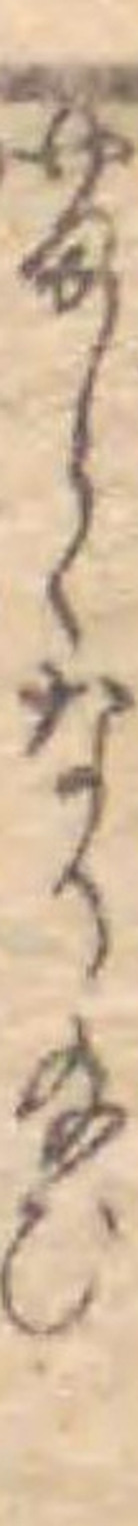やましくなり給ひ
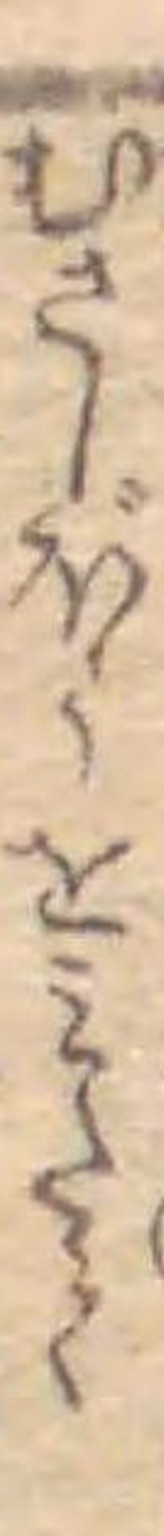むさしぼうをみたて
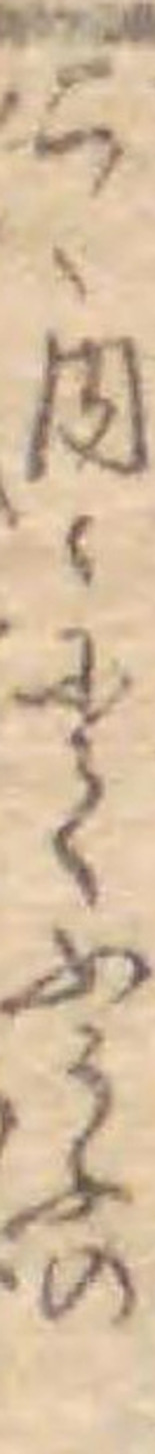こく内々にてふうふの
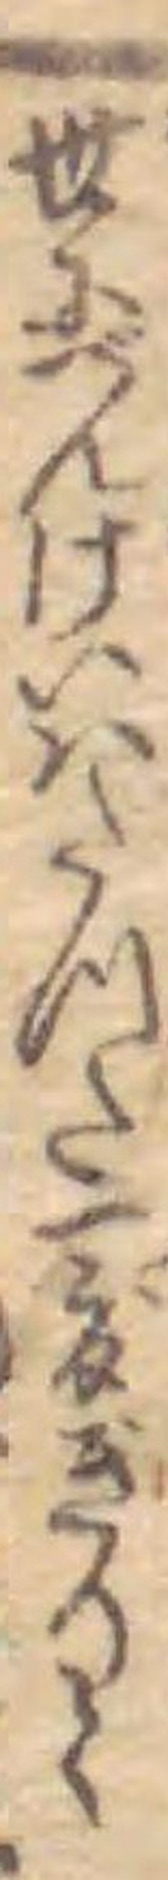世にべんけいはたつた一度きりて
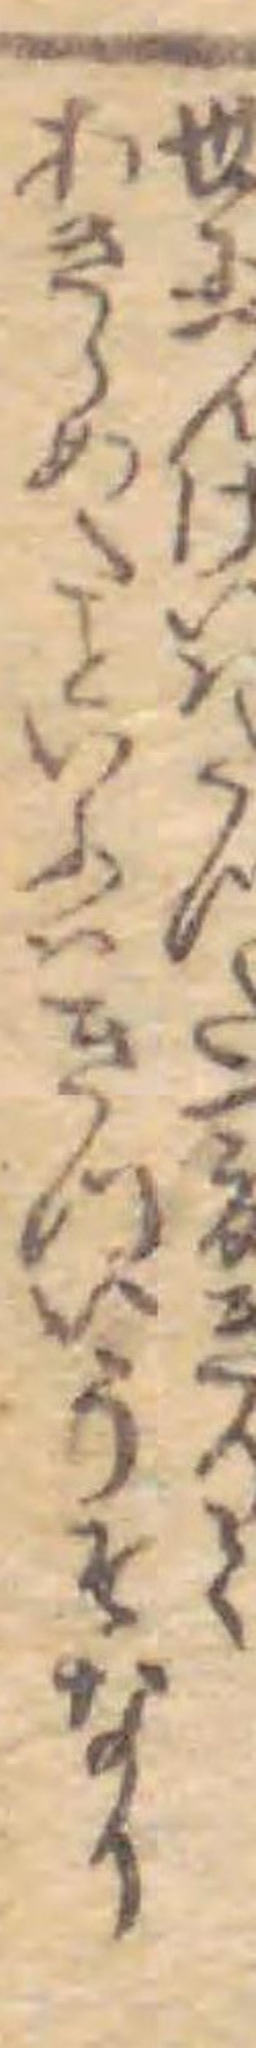あきらめたといふはきついうそなり

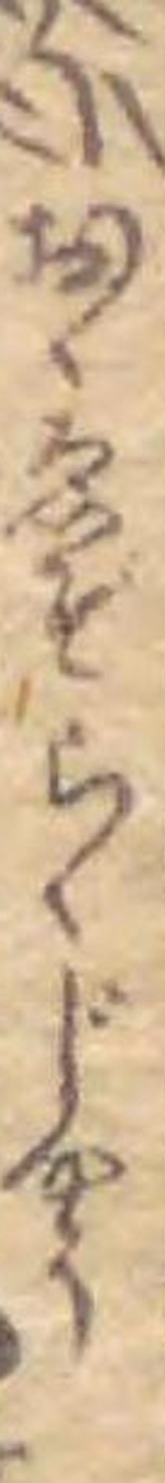おくゑぞらくじやう
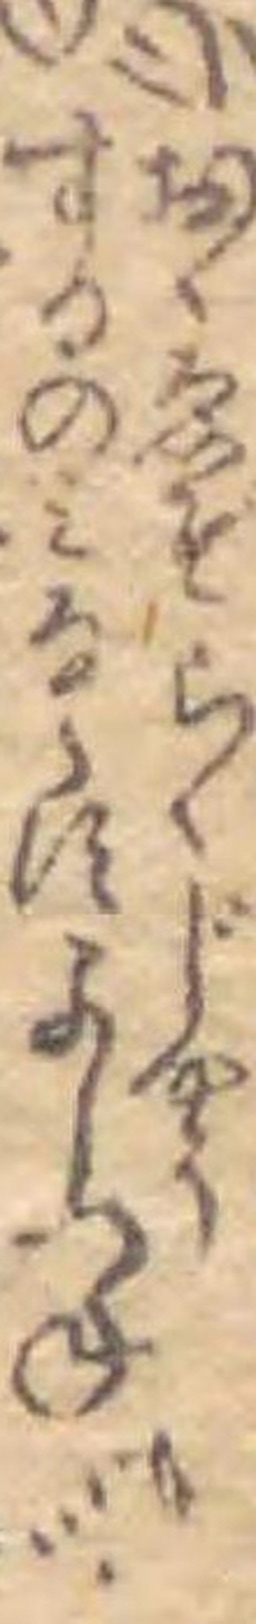するのみならすよしつね
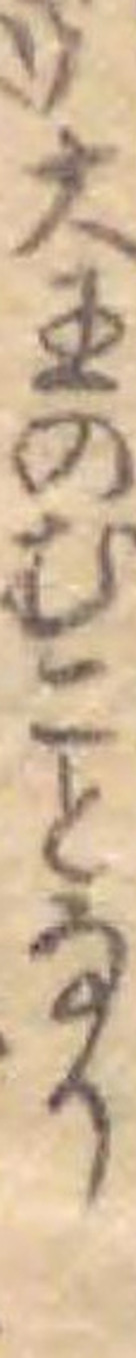大王のむことなり
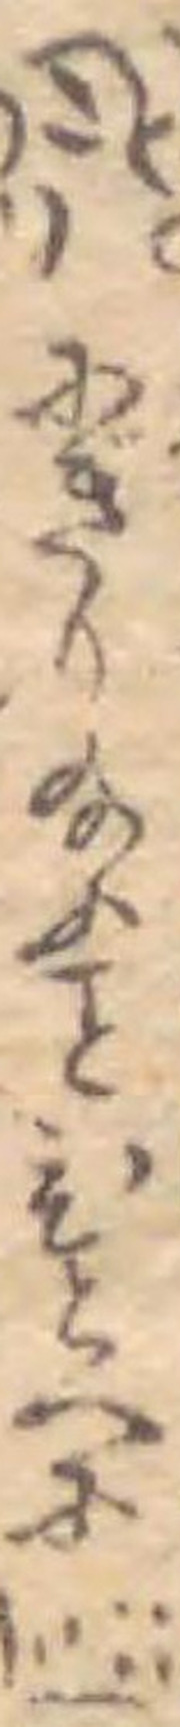にぎり給ふことひとへに
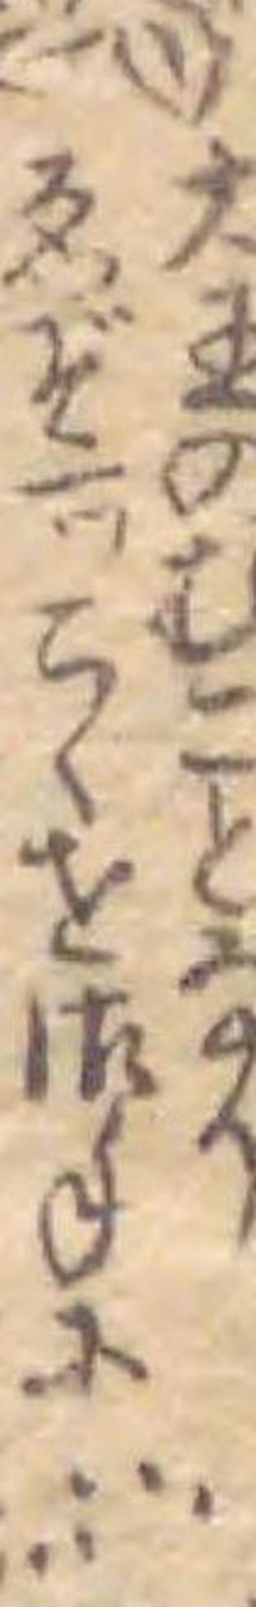ゑぞ一ッこくを御手に
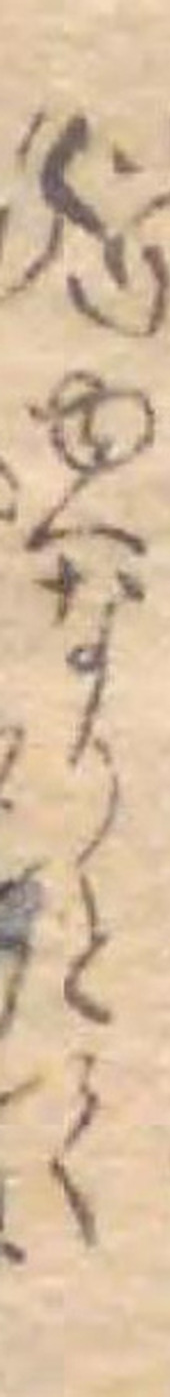ゆへなりとて
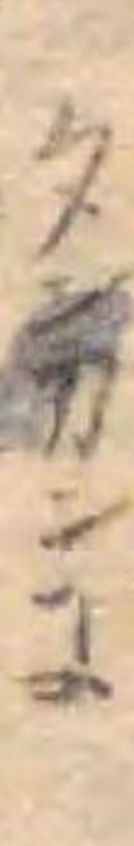タンカンに
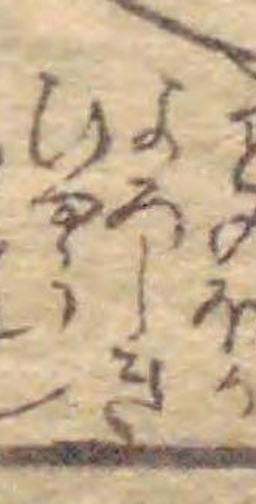ひやう
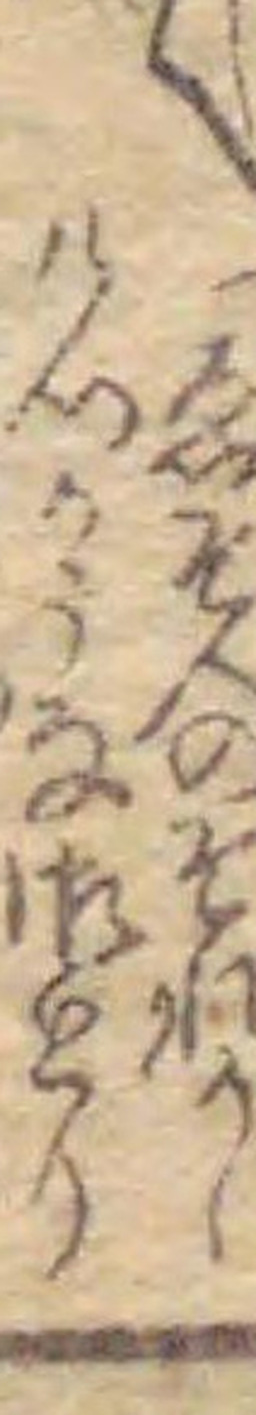けつかうな御とり
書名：悦贔負蝦夷押領 : 3巻
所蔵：国立国会図書館 National Diet Library, JAPAN
